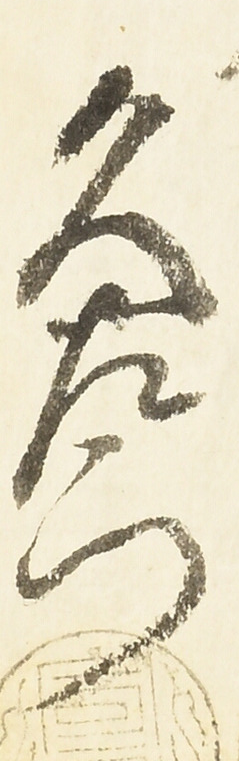久左衛門
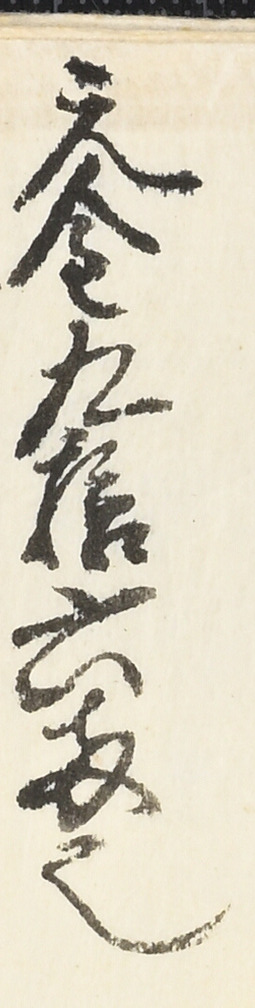元金九拾六両也
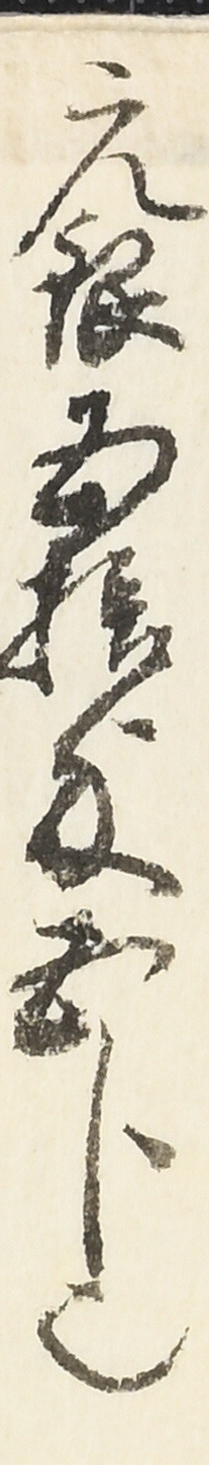元銀五拾匁五分也
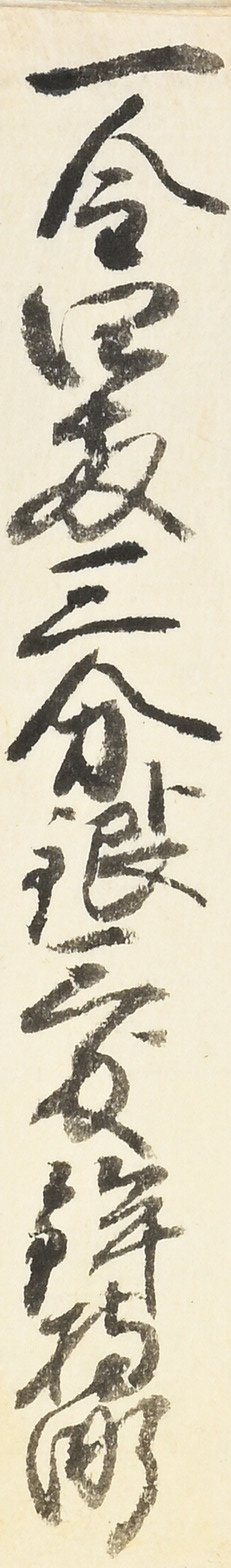一金四両三分ト銀三匁鉾持町
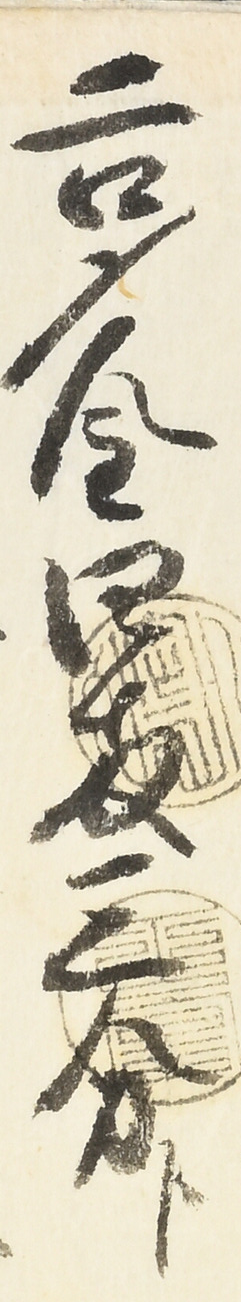二口〆金四両三分ト
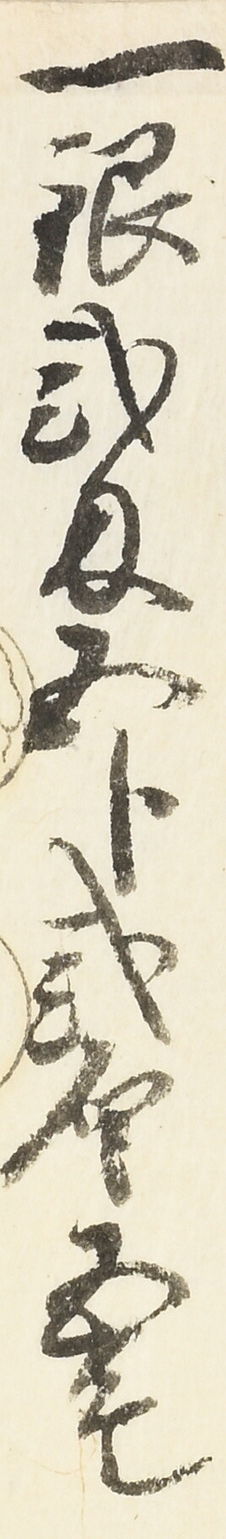一銀弐匁五分弐厘五毛
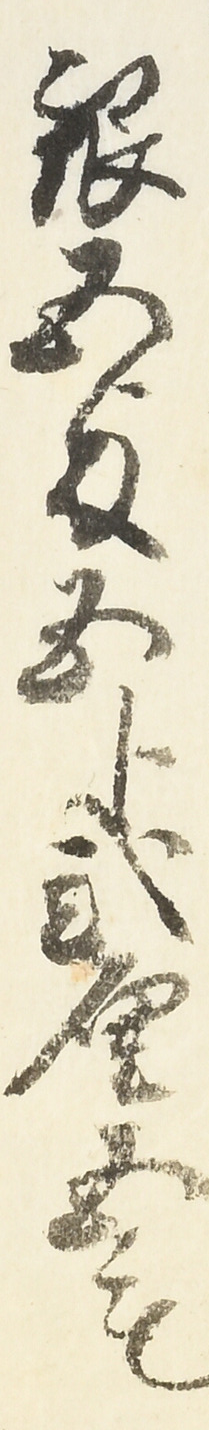銀五匁五分弐厘五毛

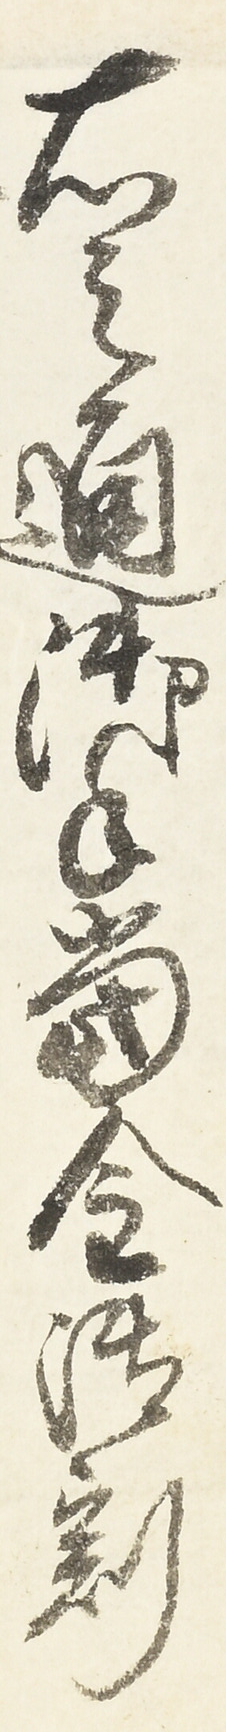右之通御手当金御割
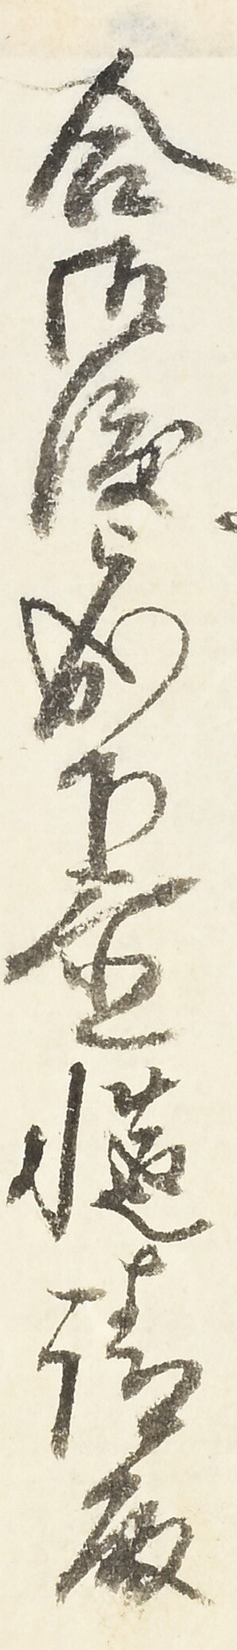合御渡被成下置慥請取
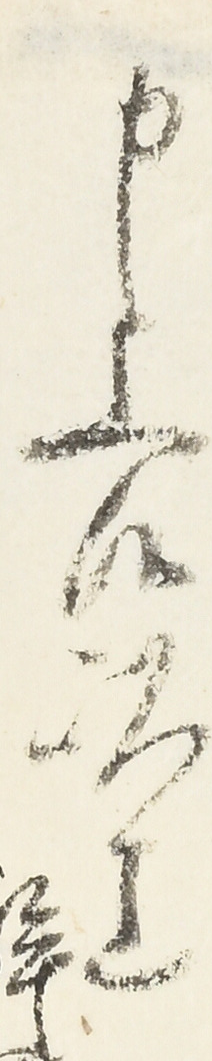申上候以上
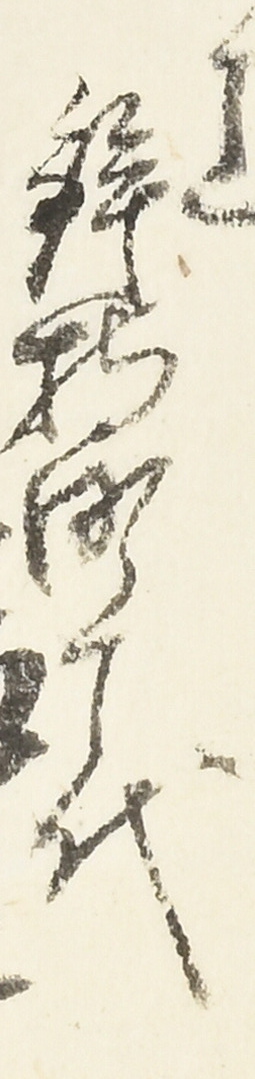鉾持町丁代
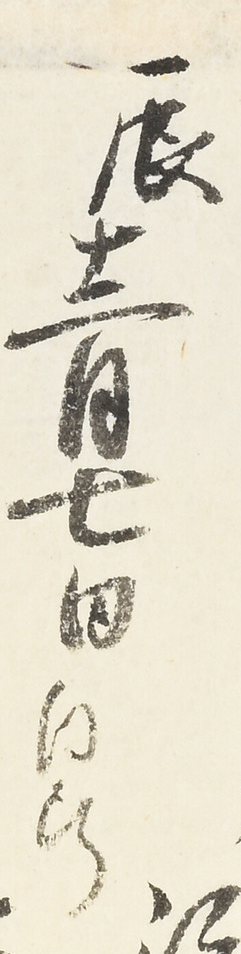十二月七日同断
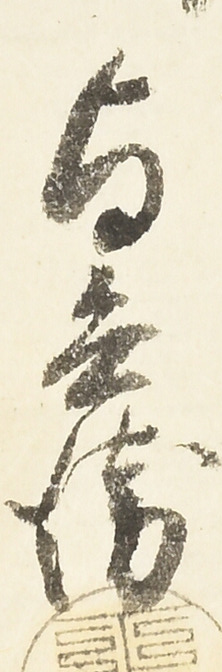与兵衛
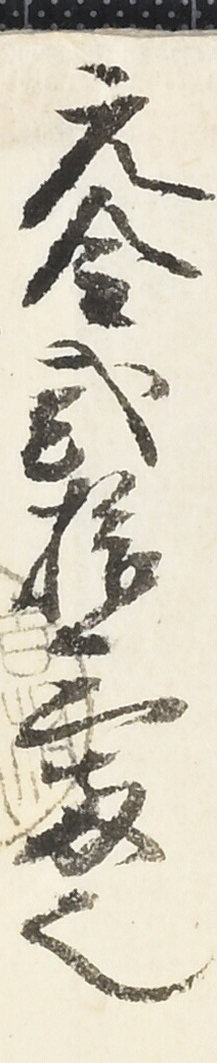元金弐拾三両也
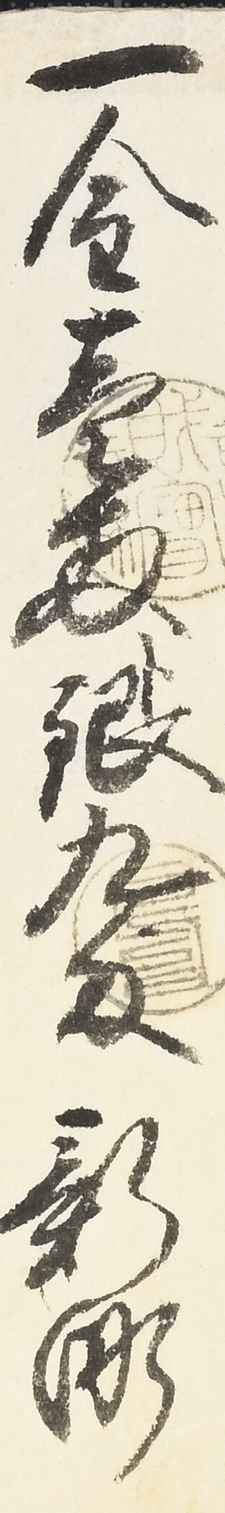一金壱両ト銀九匁新町
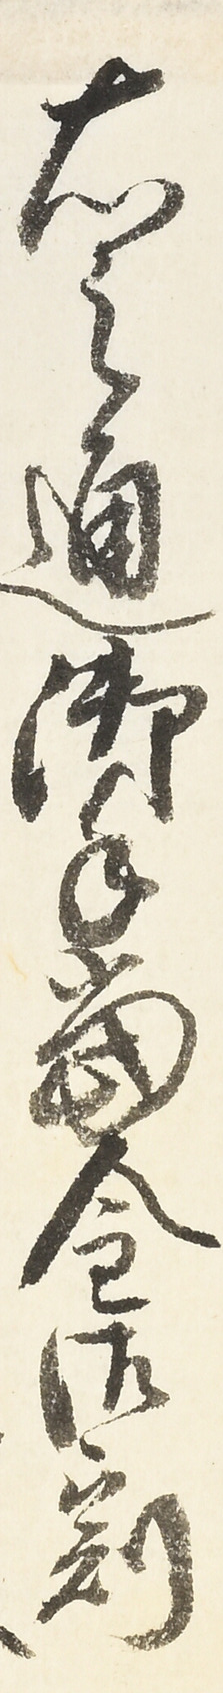右之通御手当金御割
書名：御才覚金御利足割渡扣帳
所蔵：伊那市立高遠町図書館・合同会社AMANE
